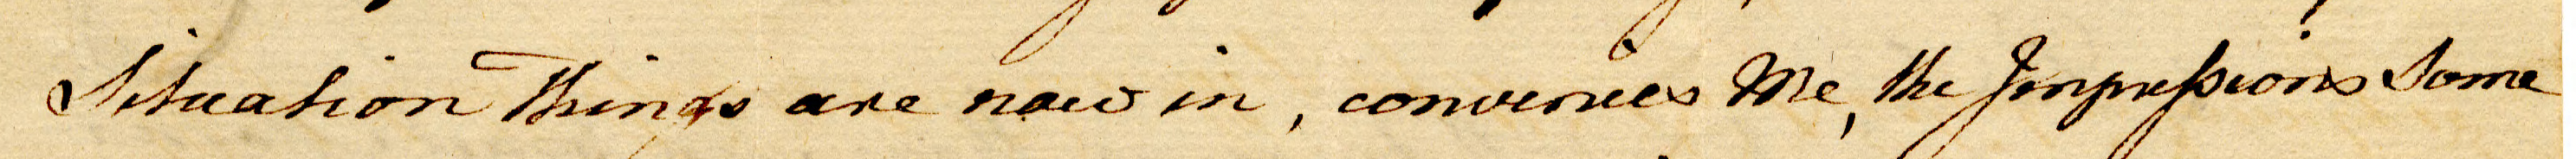Situation things are now in, convinces me, the Impressions some
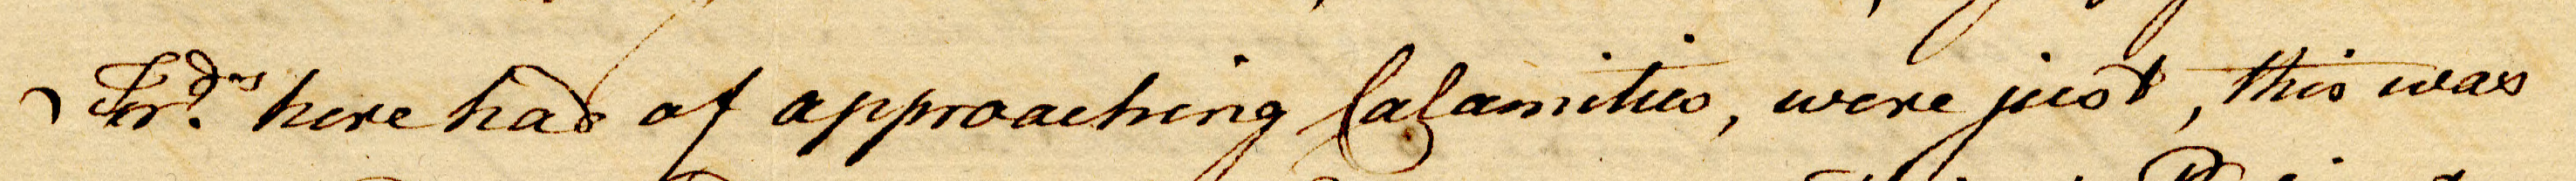Fr^ds here had of approaching Calamities, were just, this was
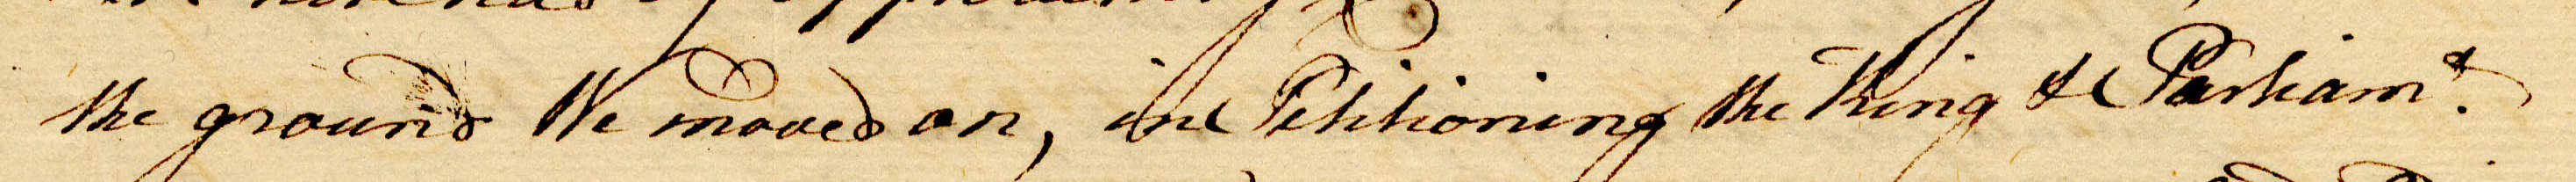the ground We moved on, in Petitioning the King & Parliam^t.
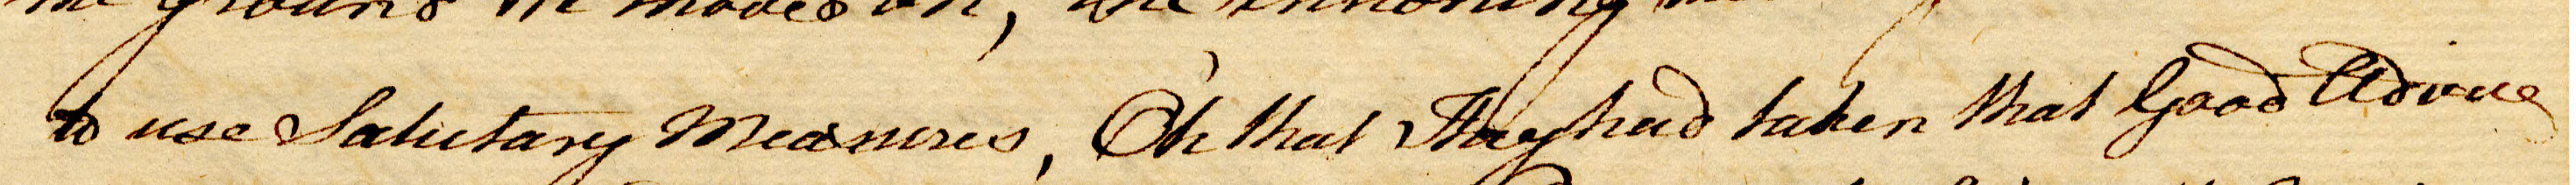to use Salutary measures, Oh that They had taken the Good Advice
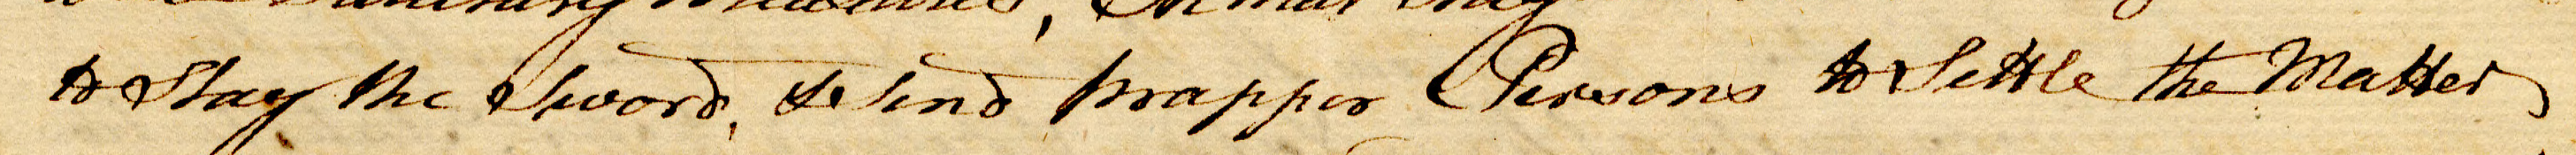to stay the Sword, & send propper Persons to Settle the Matter.
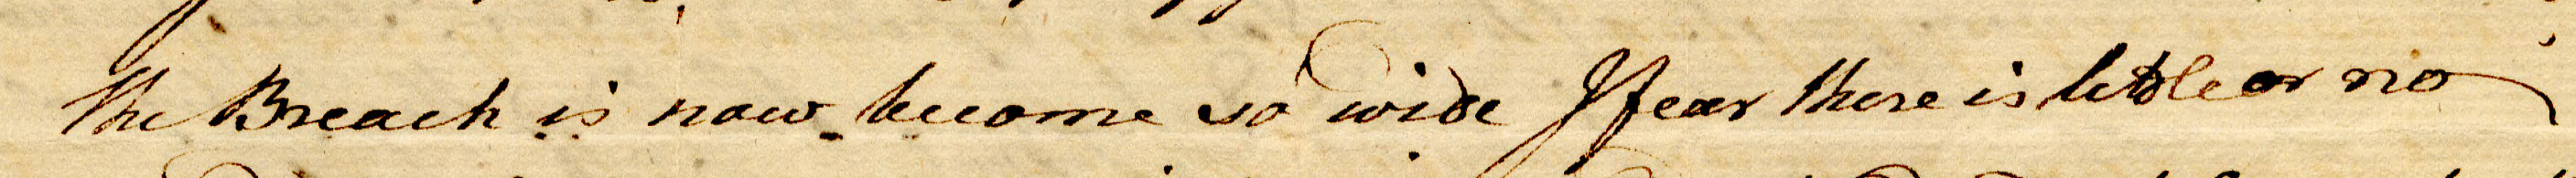The Breach is now become so wide I fear there is litdle or no
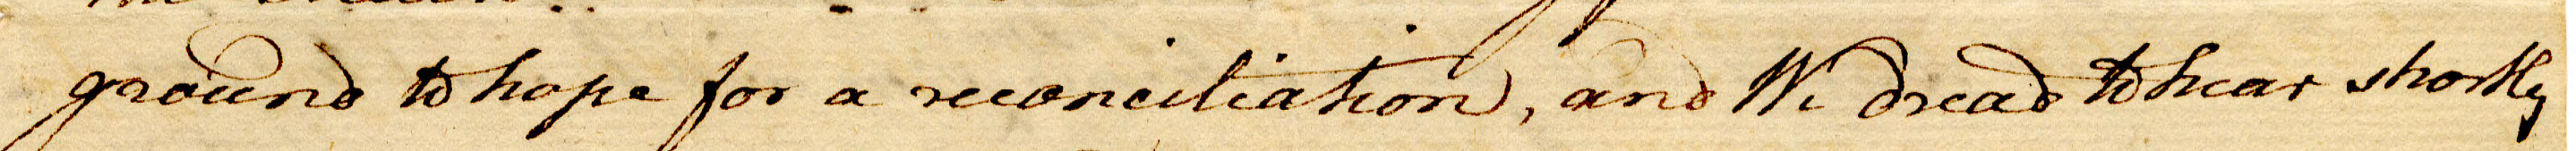ground to hope for a reconciliation, and We dread to hear shortly
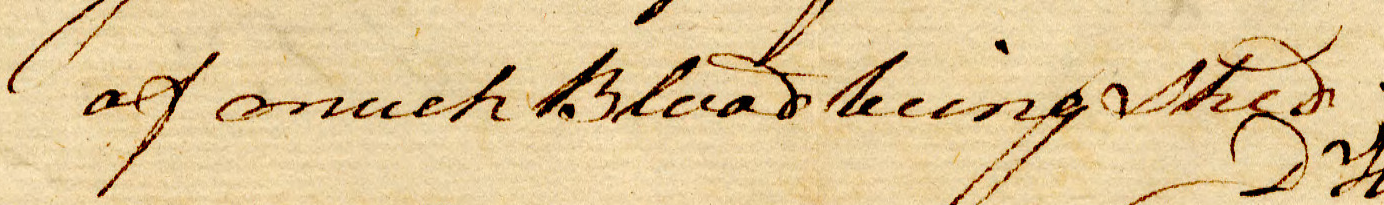of much Blood being shed.
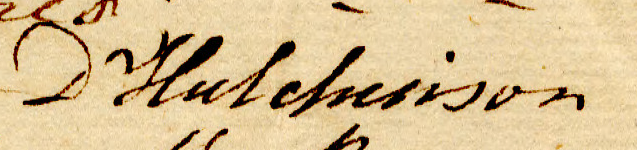D^r Hutchinson
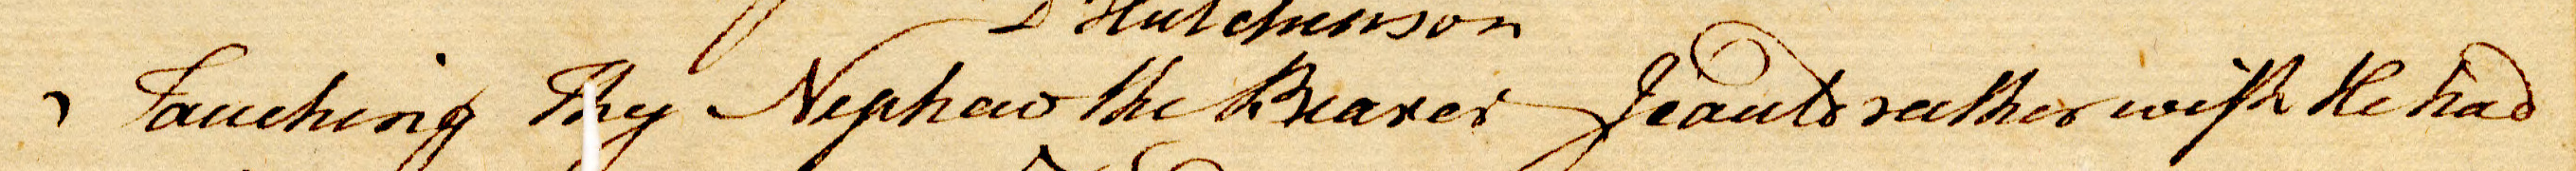Touching Thy Nephew ^ the Bearer I could rather wish he had
